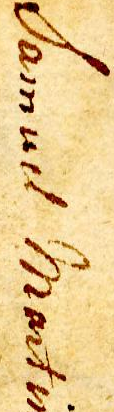Samuel Martin
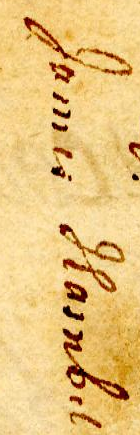James Hambel
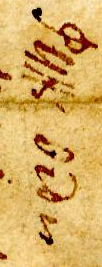Pllll Order
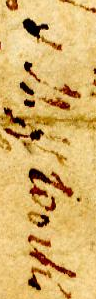& Shiff Work's
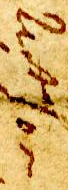Act for
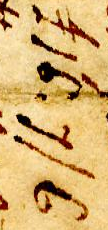£16. 7s6
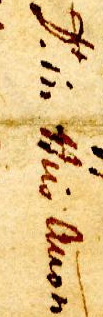D^o. in this Action
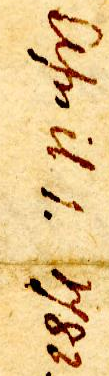April 1. 1783
